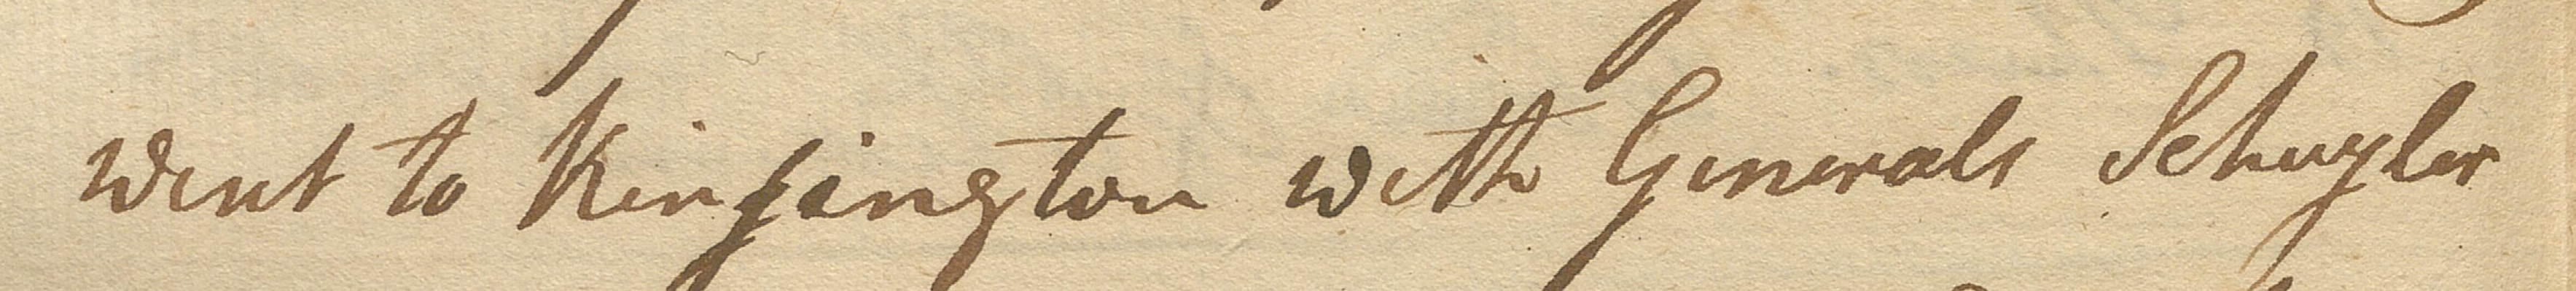went to Kinzington with Generals Schuyler
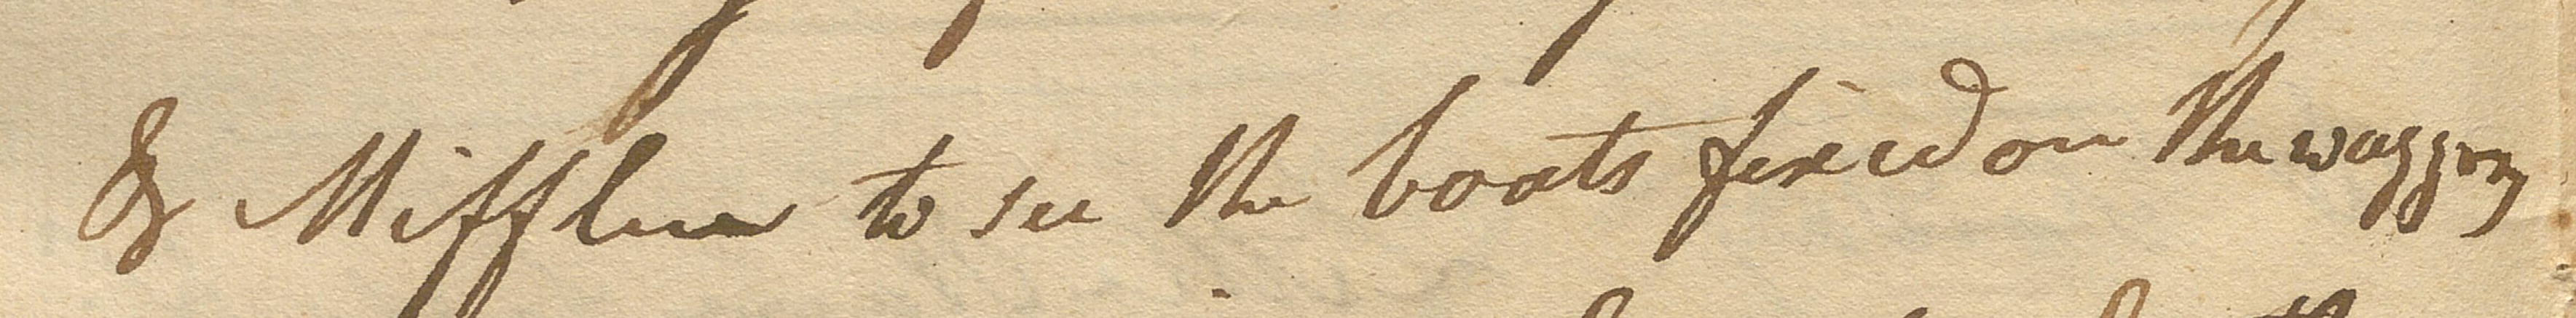& Mifflin to see the boats fixed on the waggon
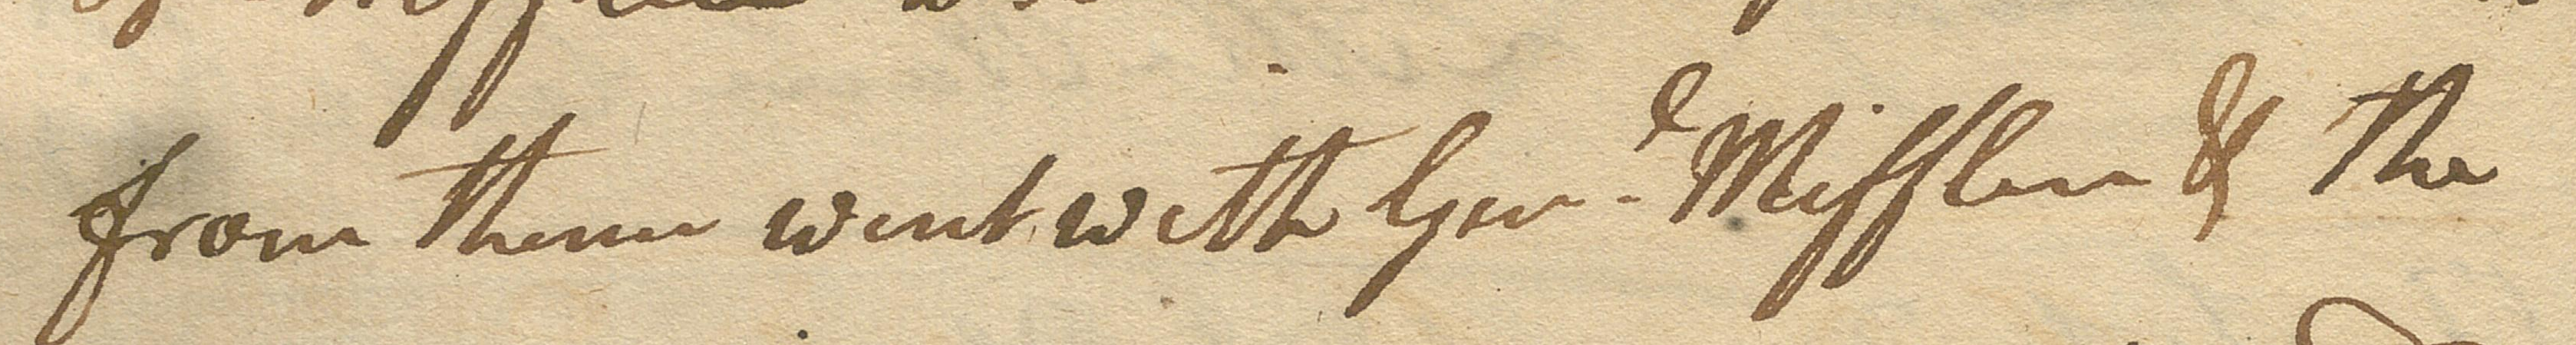from thence went with Gen^l. Mifflin & the
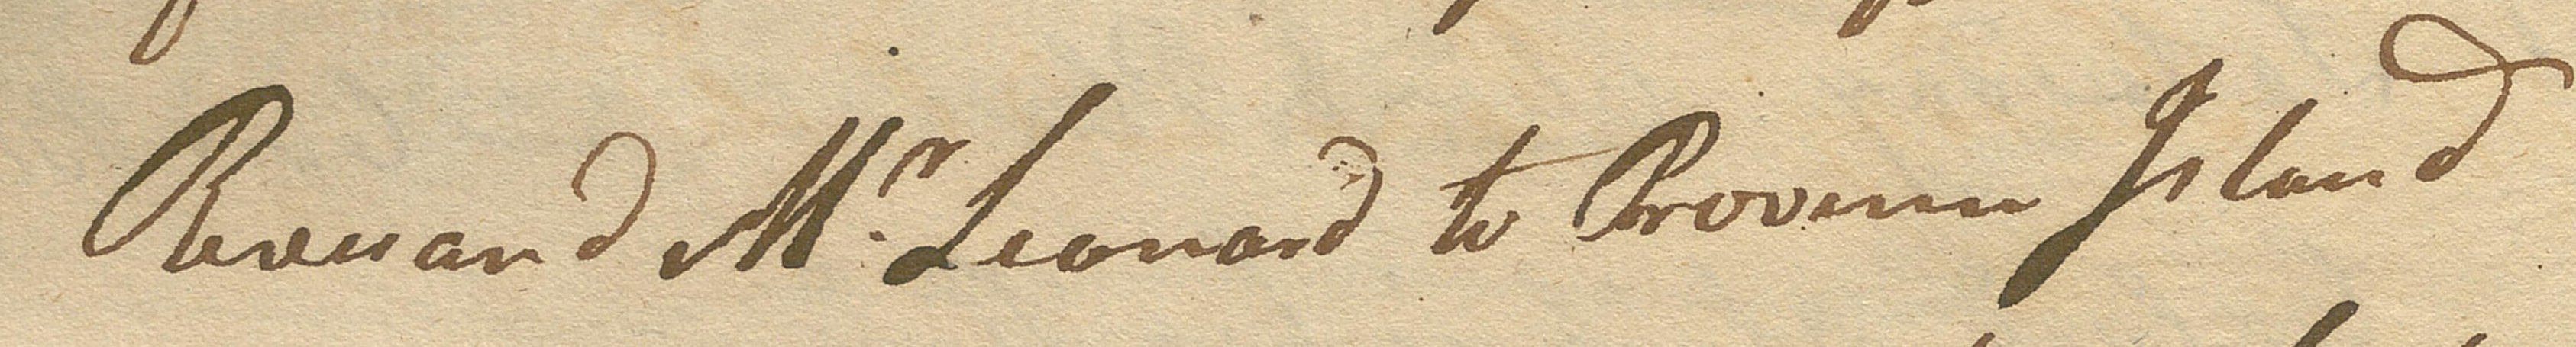Reverand M^r. Leonard to Provence Island
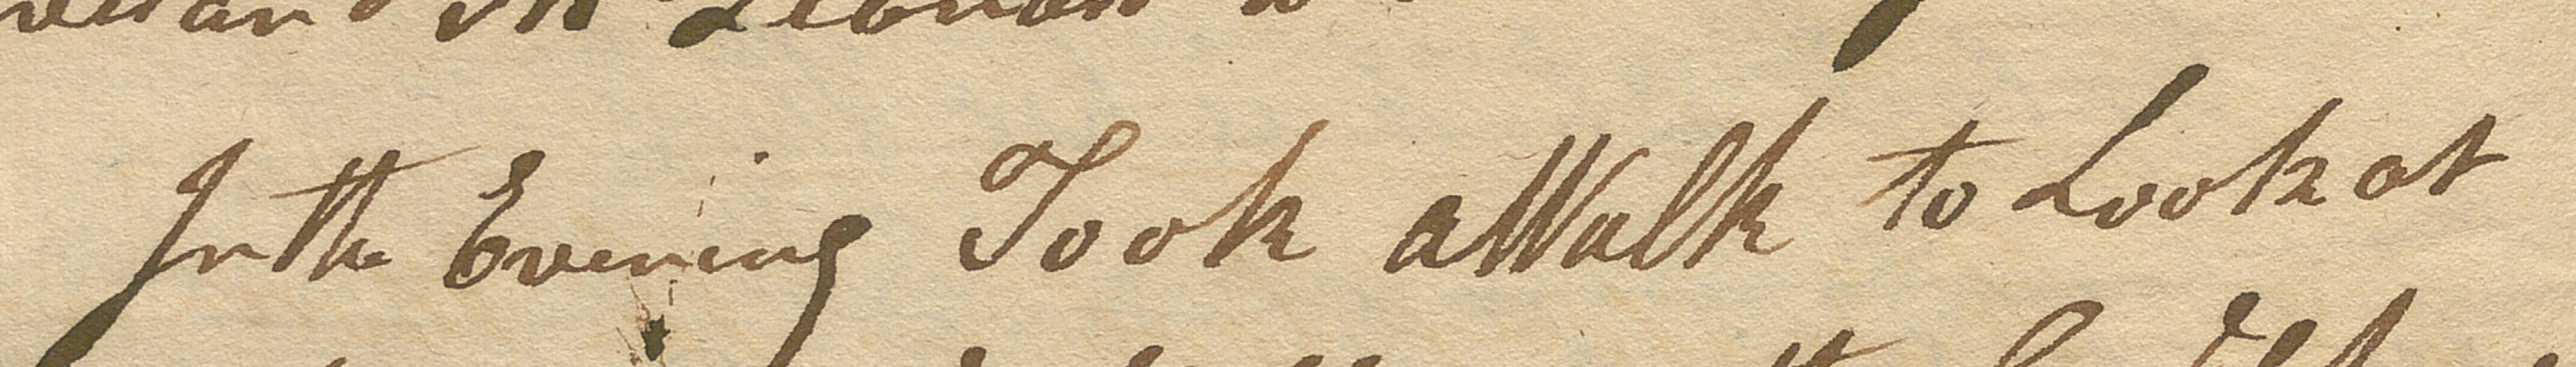In the Evening Took a Walk to Look at
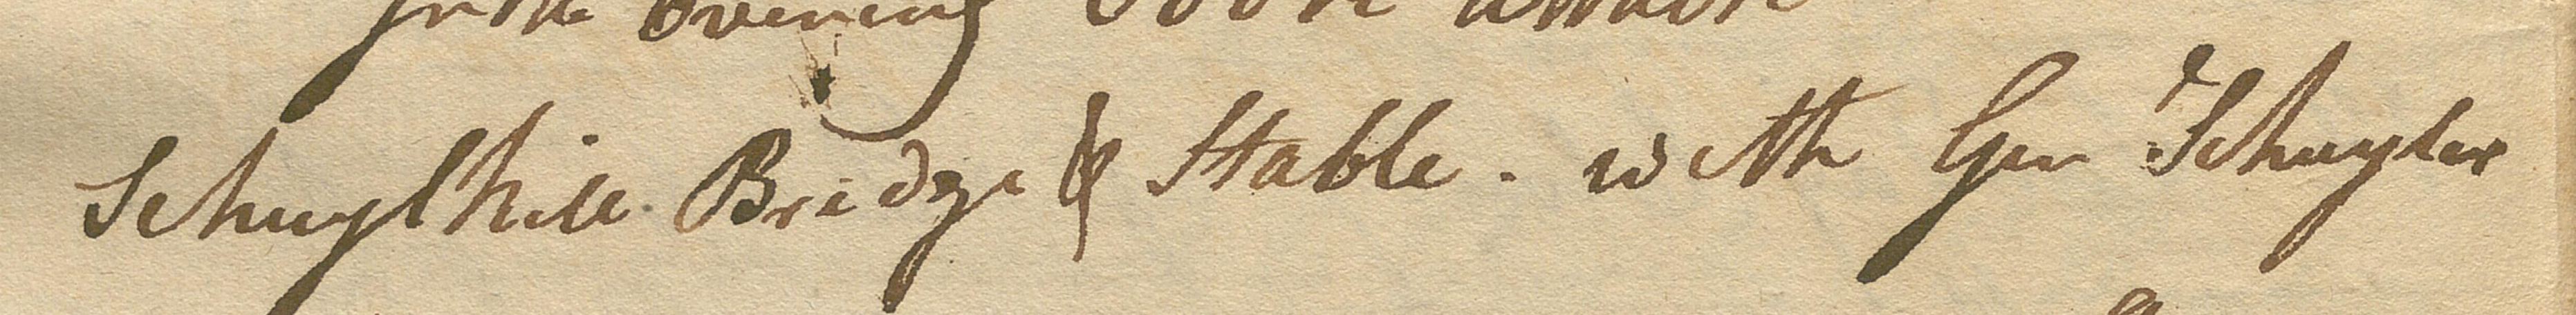Schuylkill Bridge & Stable. with Gen^l. Schuyler
